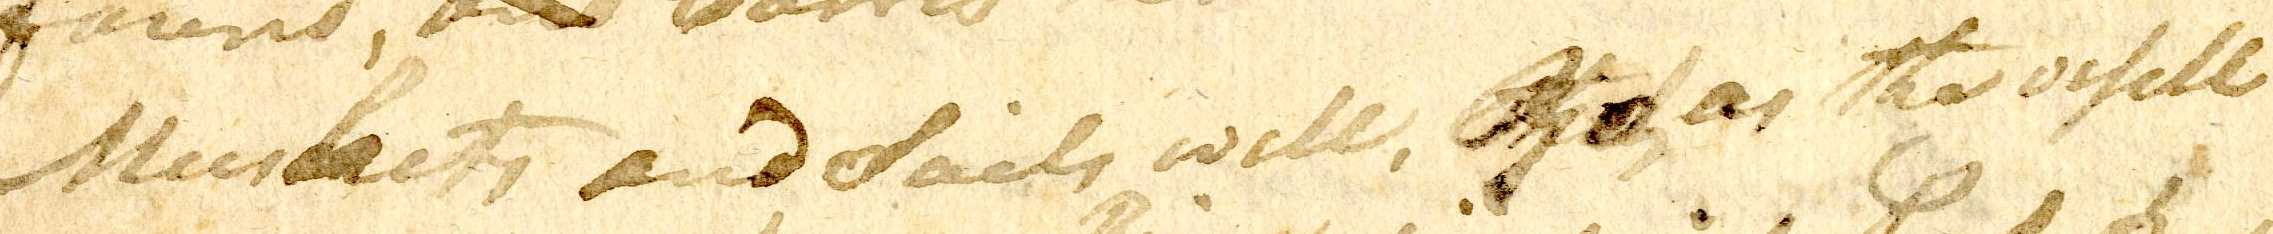Muskets and sails well, [___] as the vessell
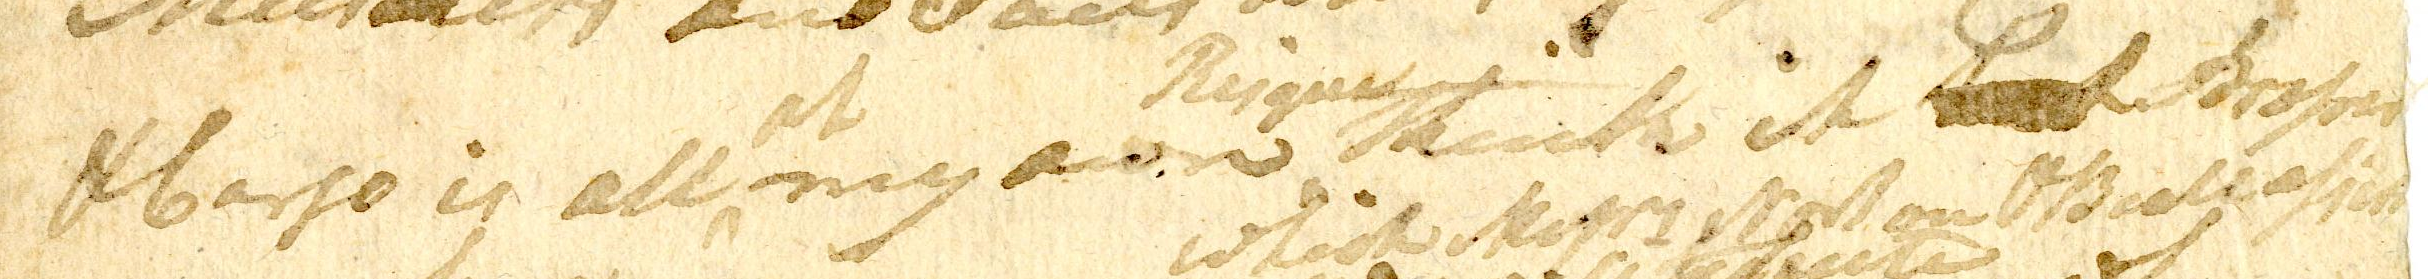& Cargo is all ^ my own ^ think it [____] proper
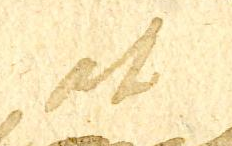at
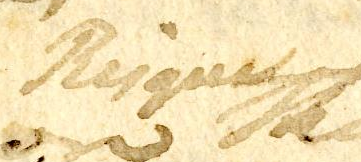Risque
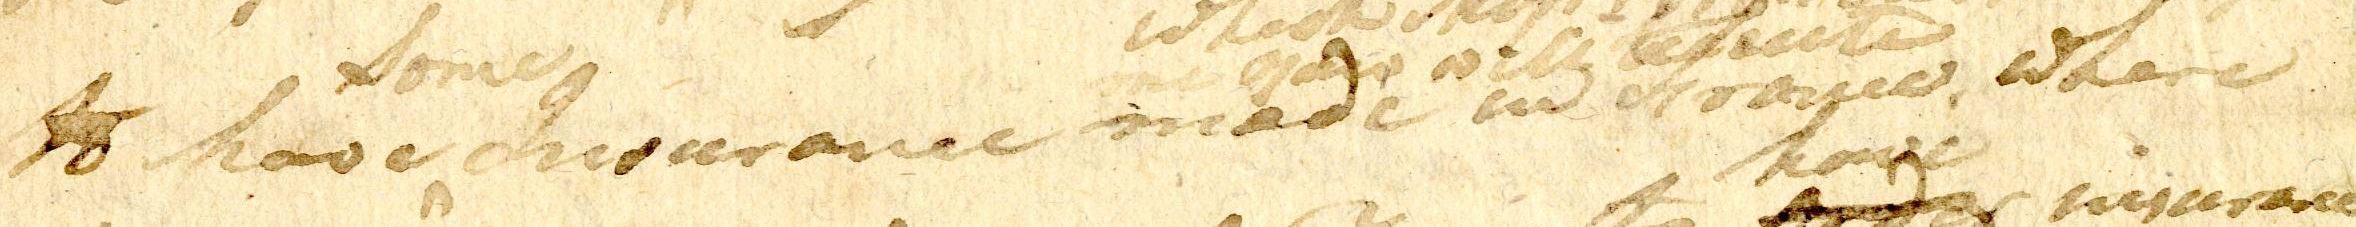to have ^ Insurance made in Stoage, where
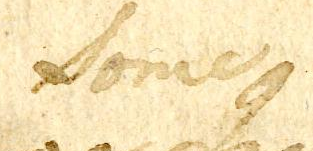some
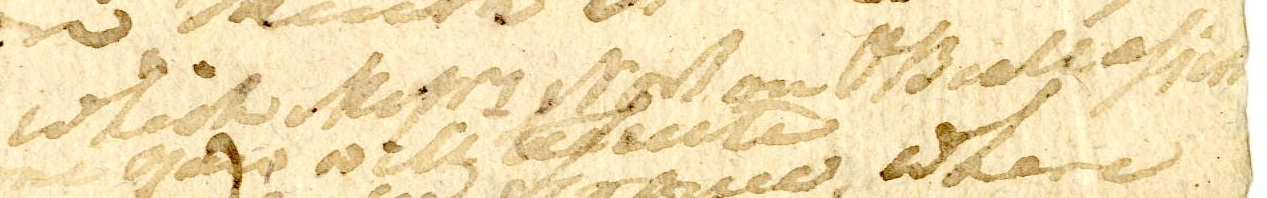which Mess^rs Norton & Beall first
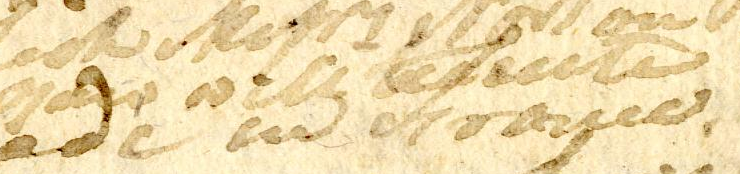you will execute
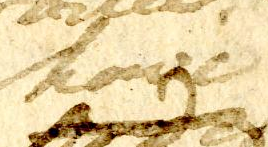have
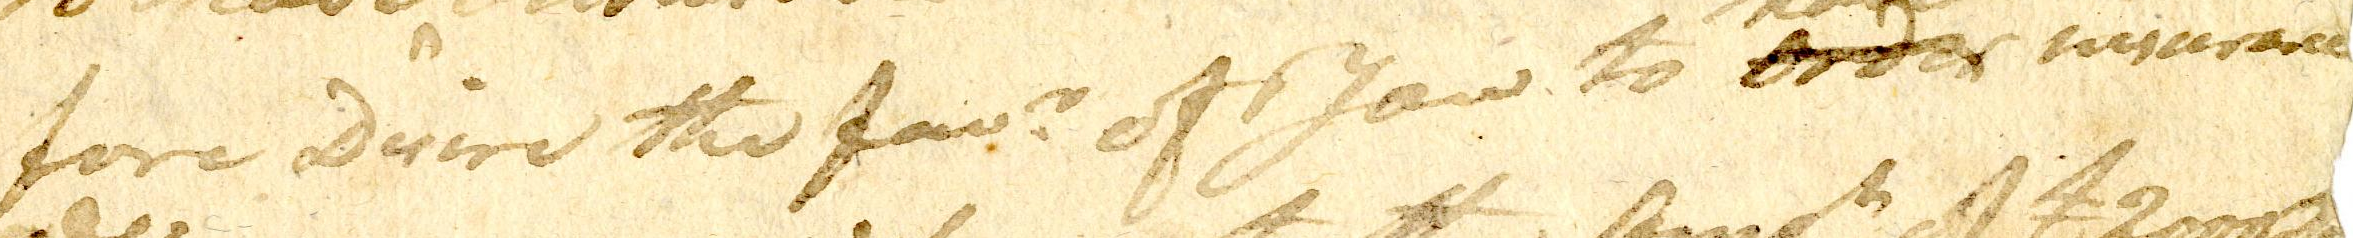fore Desire the fav^r. of you to [order] insurance
